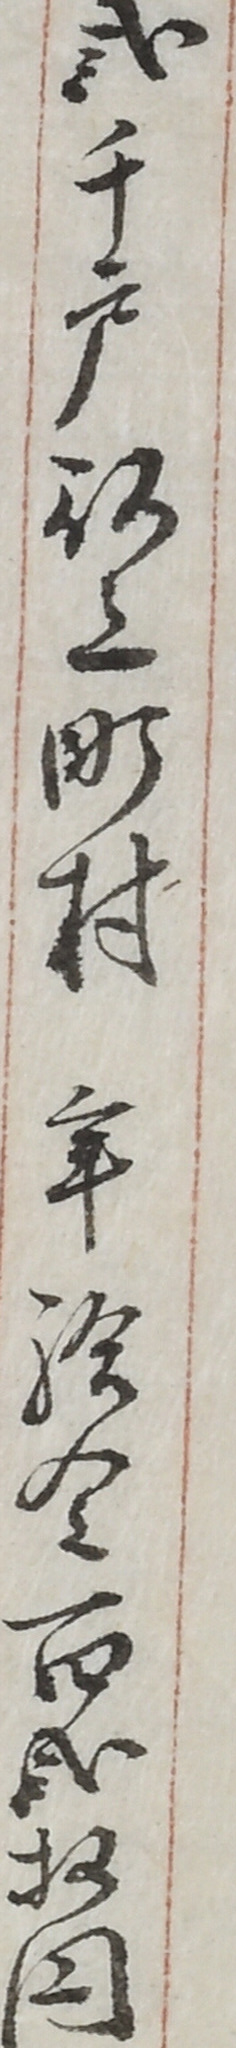戸数弐千戸以上町村年給金百弐拾円
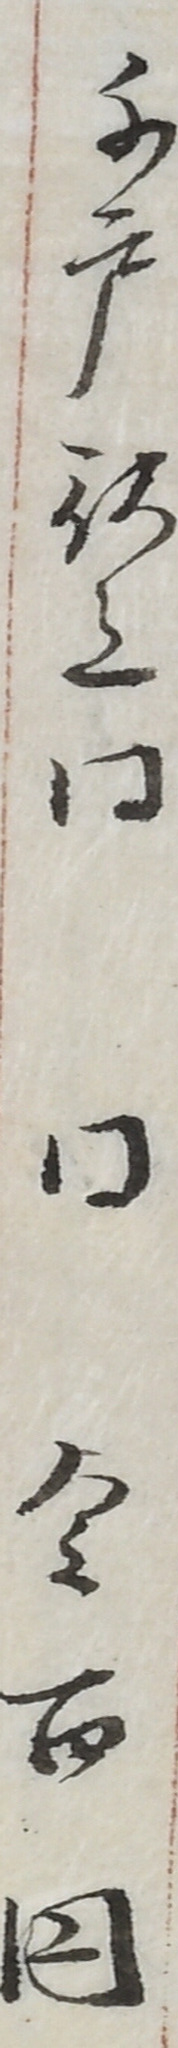同千戸以上同同金百円
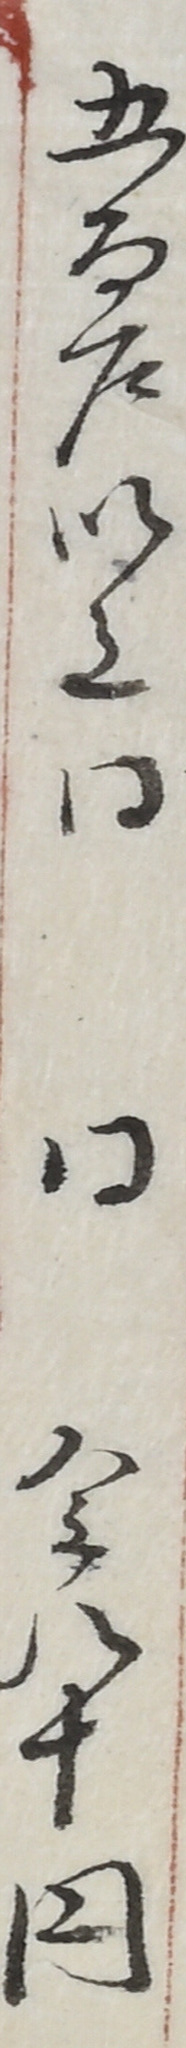同五百戸以上同同金八十円

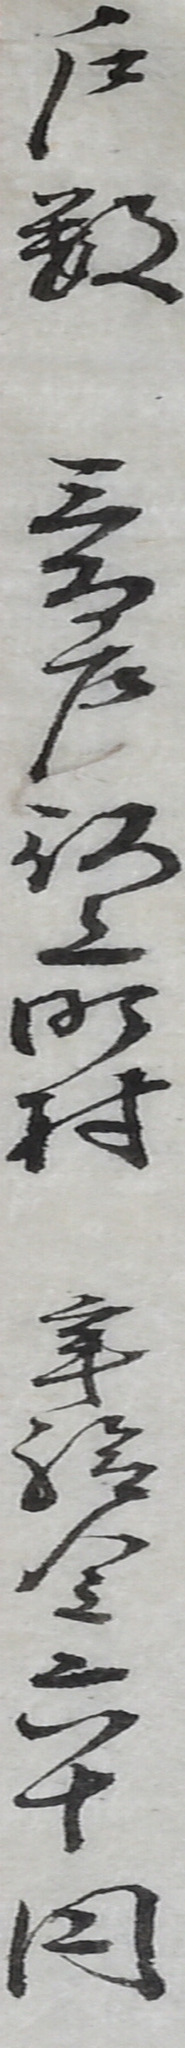戸数三百戸以上町村年給金六十円
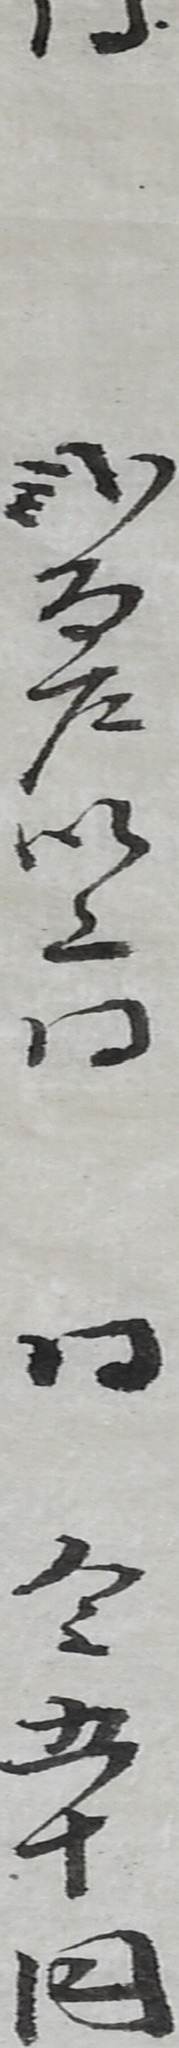同弐百戸以上同同金五十円
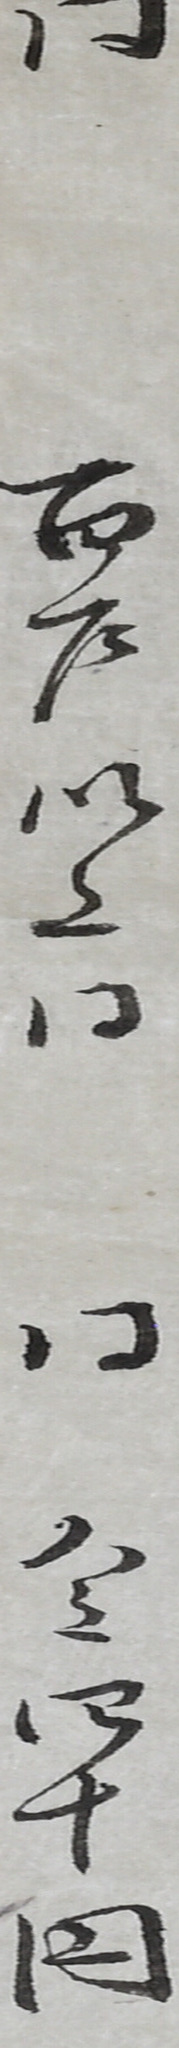同百戸以上同同金四十円
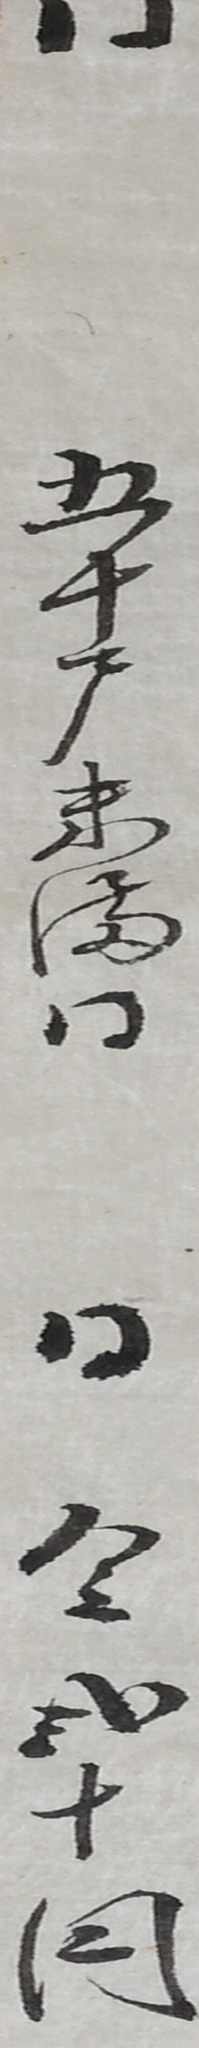同五十戸未満同同金弐十円
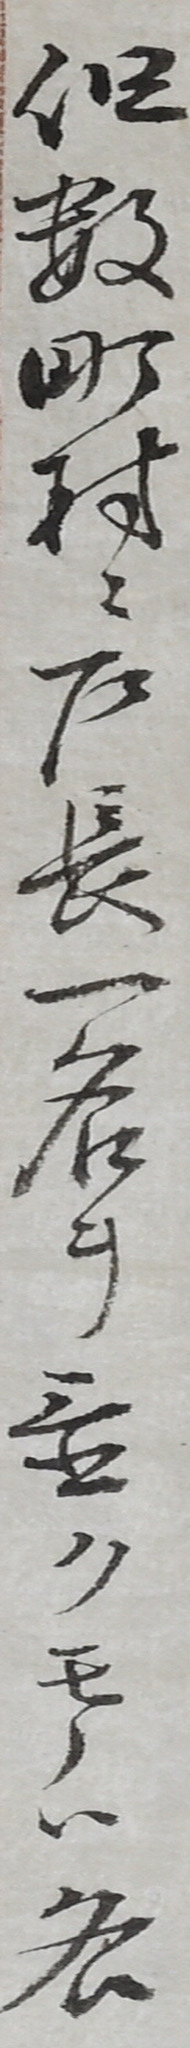但数町村々戸長一名ヲ置クモノハ各
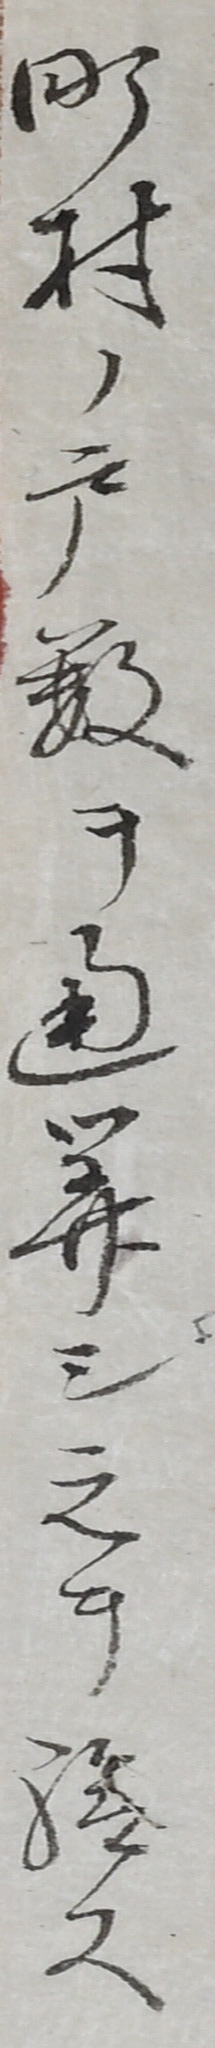町村ノ戸数ヲ通算シ之ヲ継給ス
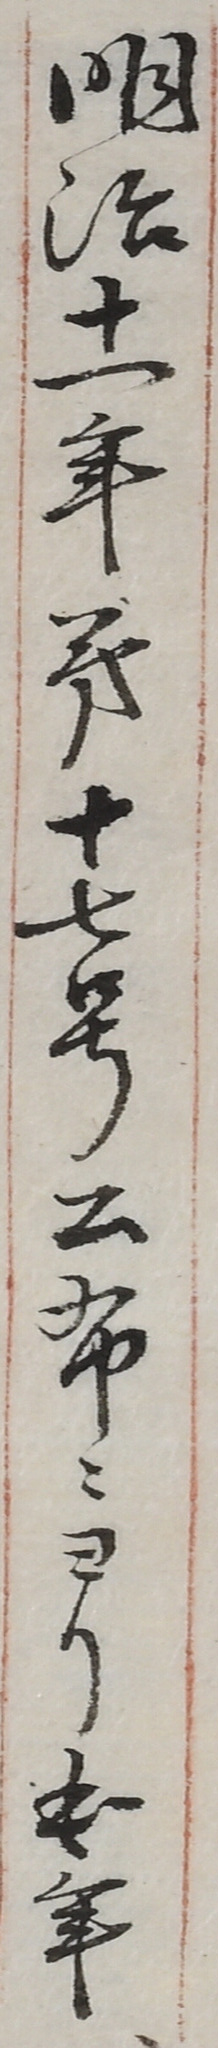明治十一年第十七号公布ニヨリ本年
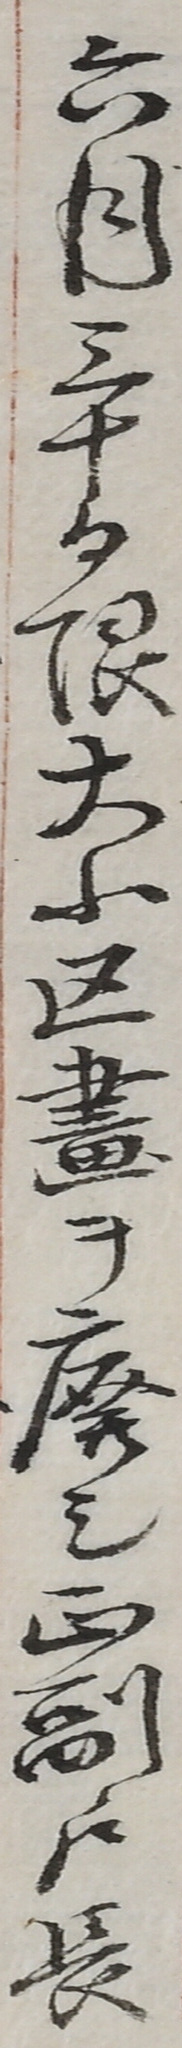六月三十日限大小区画ヲ廃シ正副戸長
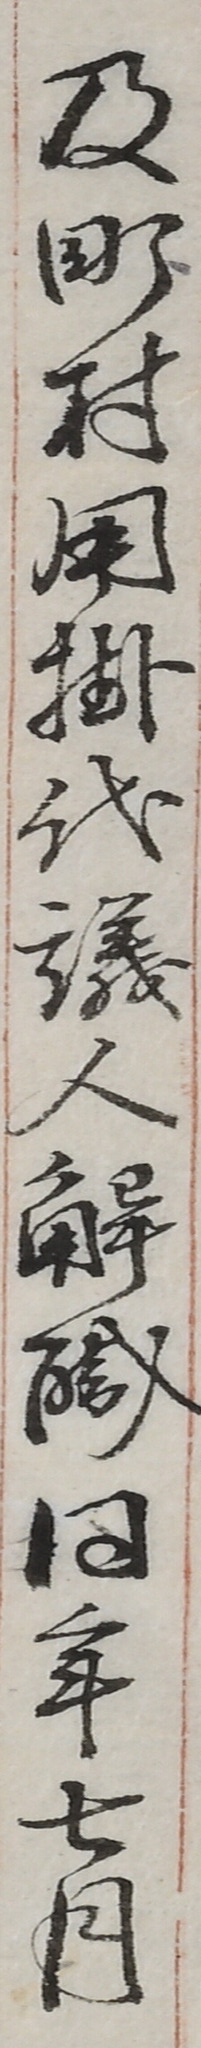及町村用掛代議人解職同年七月
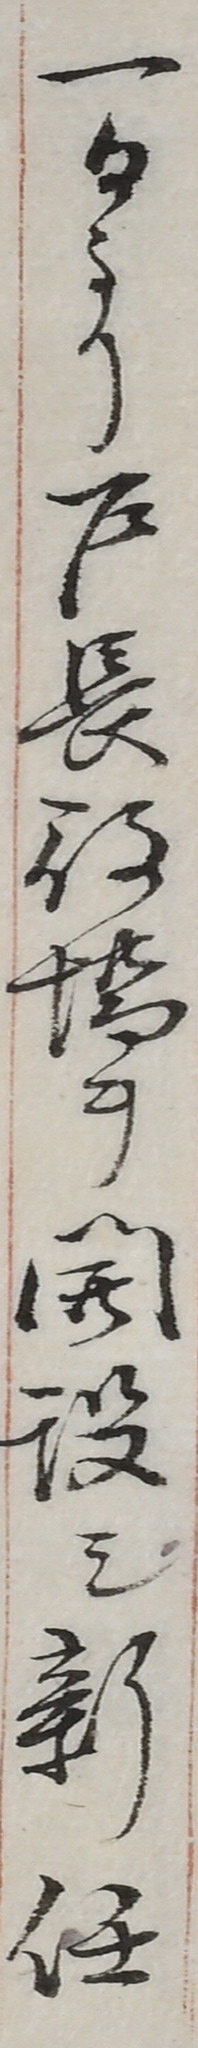一日より戸長役場ヲ開設シ新任
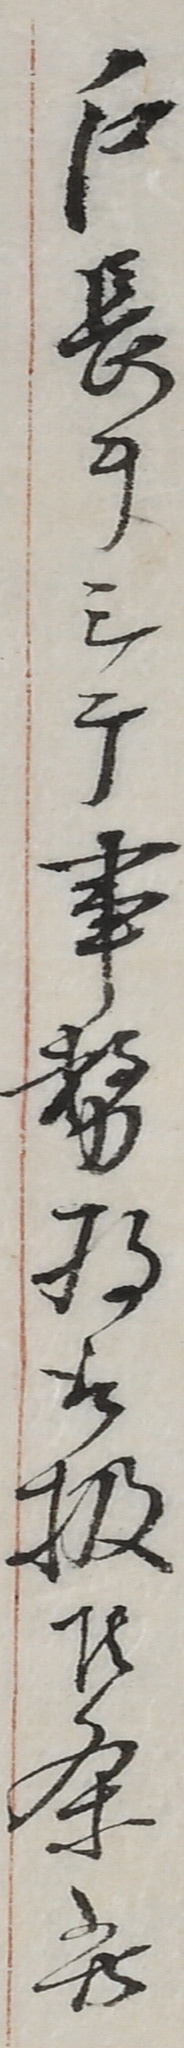戸長ヲシテ事務為取扱候条此
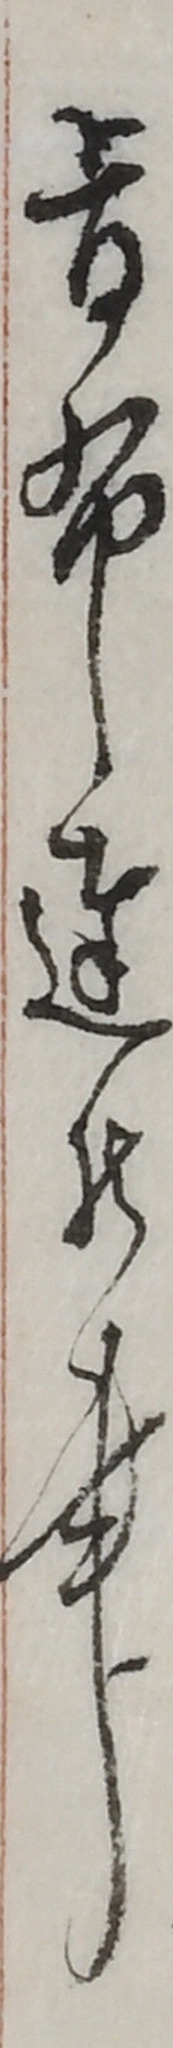旨布達候事
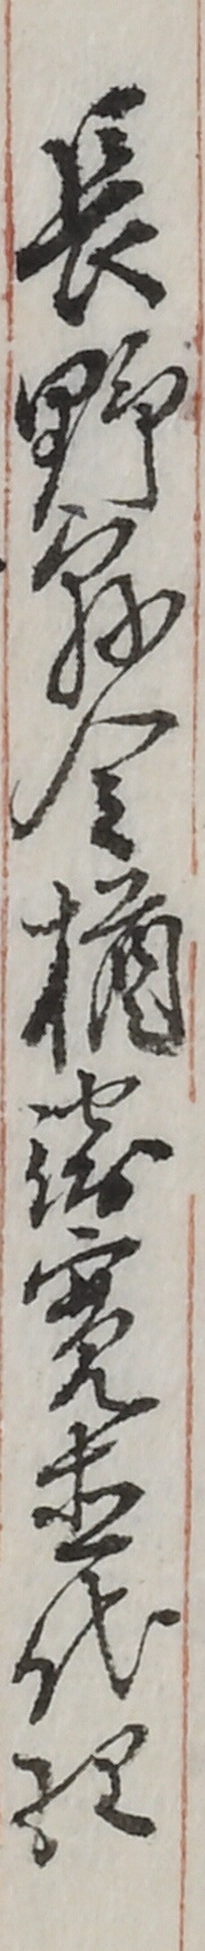長野県令楢崎寛直代理
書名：郡役所勤務中御用抜書
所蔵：伊那市立高遠町図書館・合同会社AMANE
